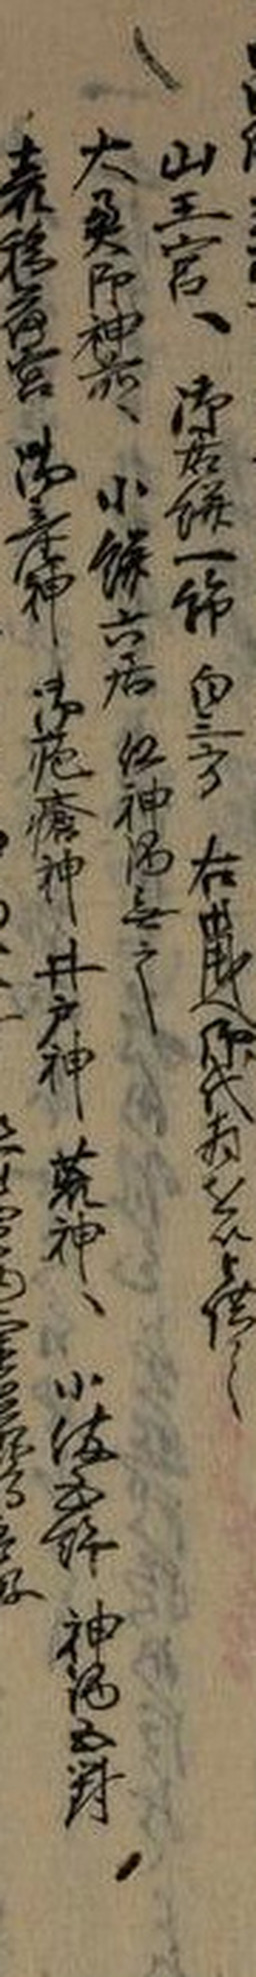表稲荷宮御産神御疱瘡神井戸神荒神へ小備五飾神酒五対
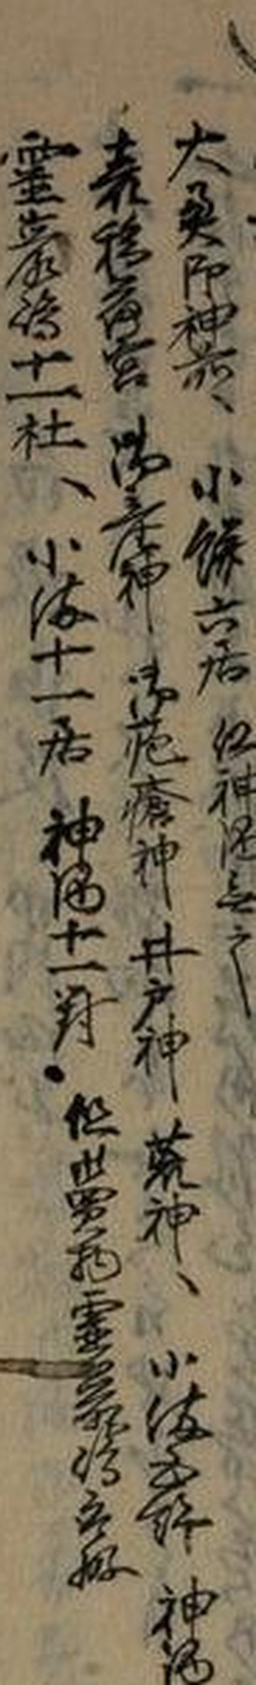霊岸嶋十一社へ小備十一居神酒十一対但御買物霊岸嶋取扱
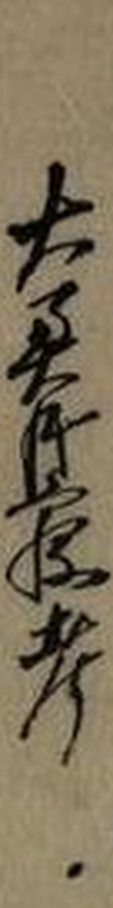大奥御寝考
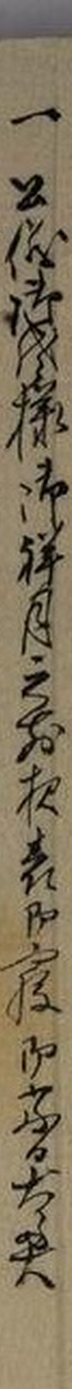一公儀御代々様御祥月之前夜表御寝御当日大奥
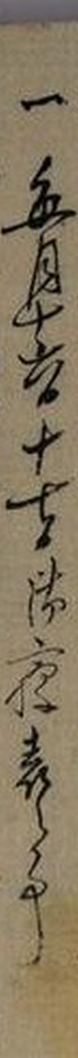一毎月十六日十七日御寝表之事
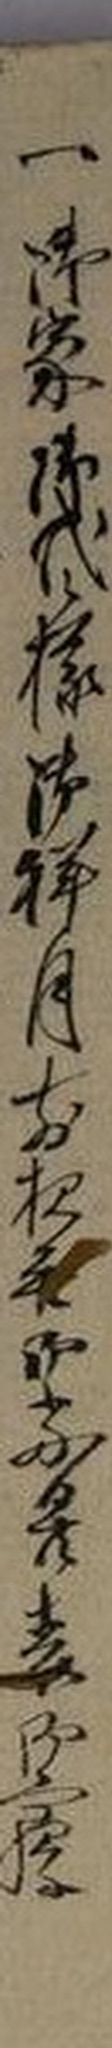一御家御代々様御祥月前夜并御当日共表御寝
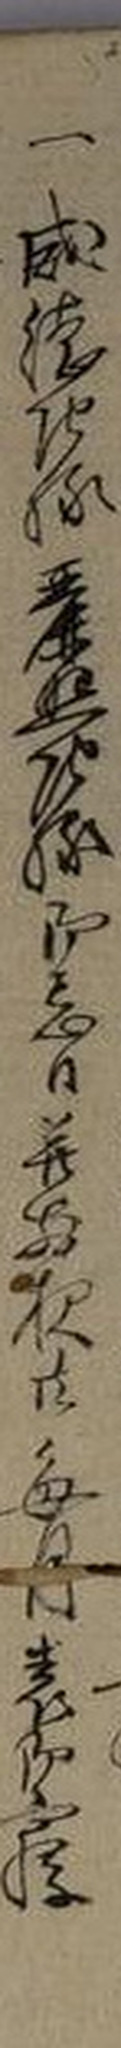一威徳院様麗照院御忌日并前夜共毎月表御寝
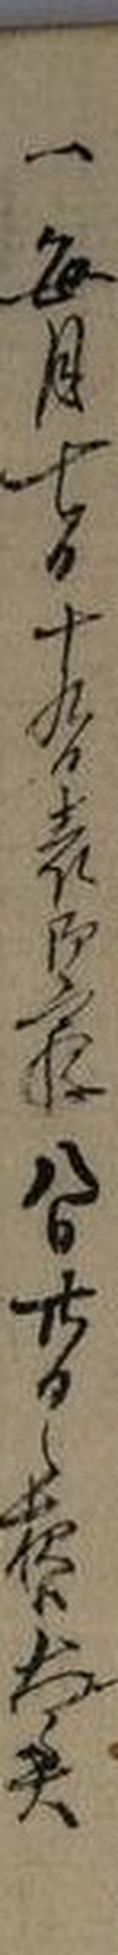一毎月七日十九日表御寝八日廿日之夜ハ大奥
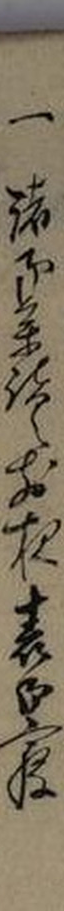一諸御参詣之前夜表御寝
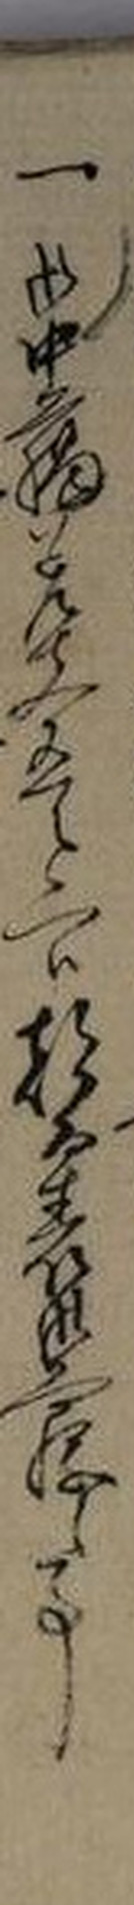一御中臈差支有之候へハ都而表御寝候事
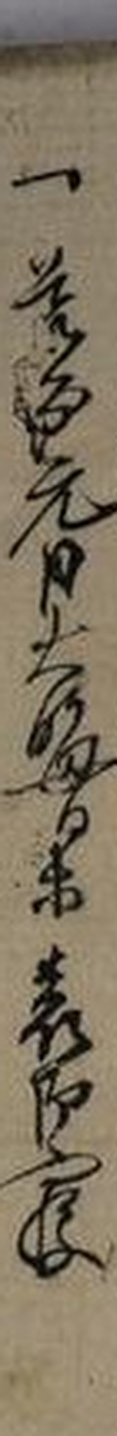一暮ゟ元日大晦日等表御寝
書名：少傅日録抄（斉承付側向頭取日記、在国）
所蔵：福井県文書館 Fukui Prefectural Archives
